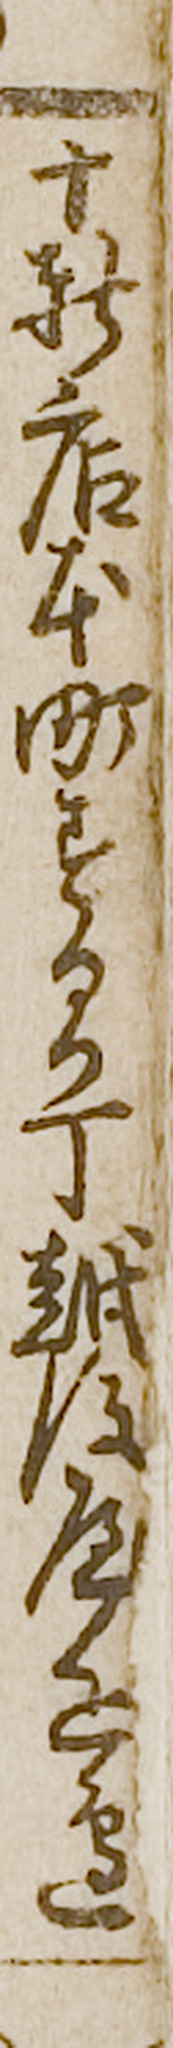十軒店本町するか丁越後屋近辺
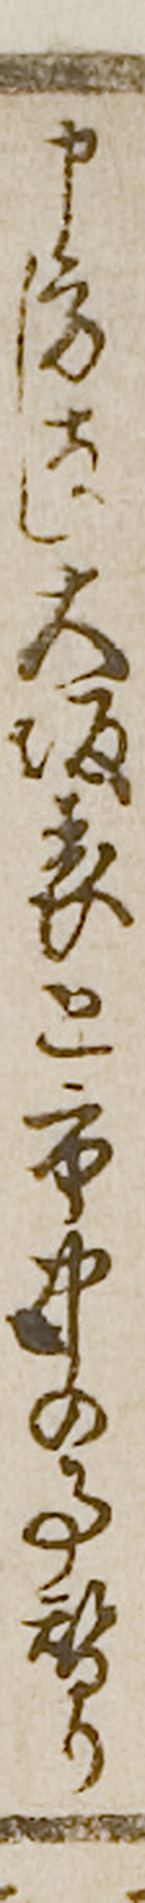申方なし大坂表と市中の事替り
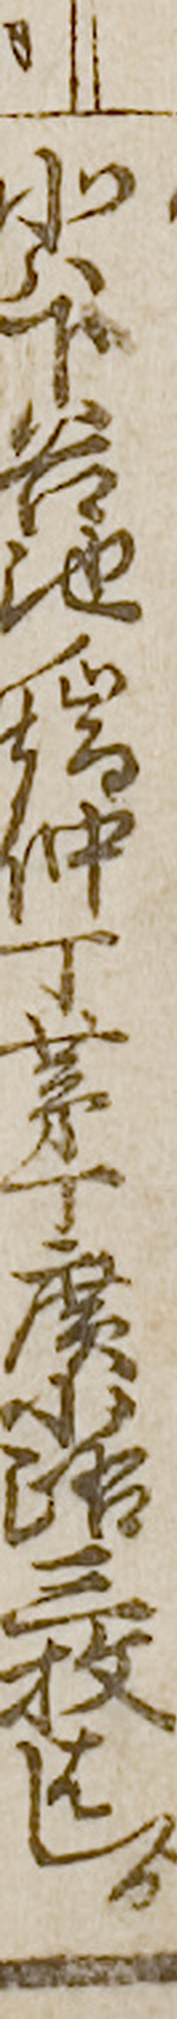北は下谷池の端仲丁茅丁広小路三枚はしゟ
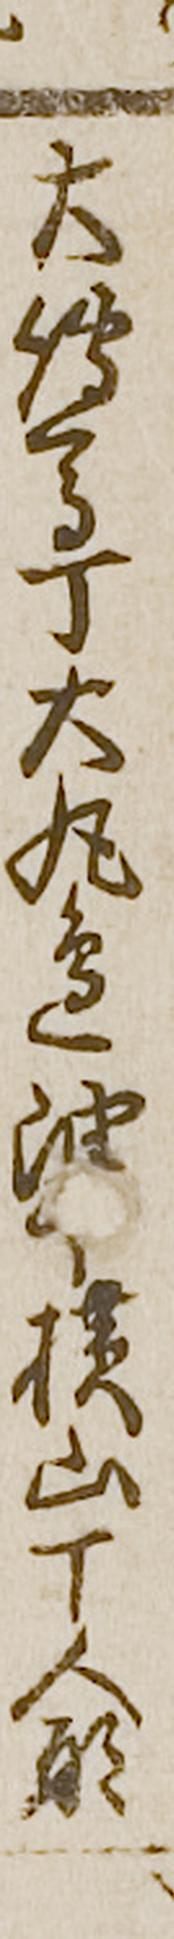大伝馬丁大丸辺油丁横山丁人形
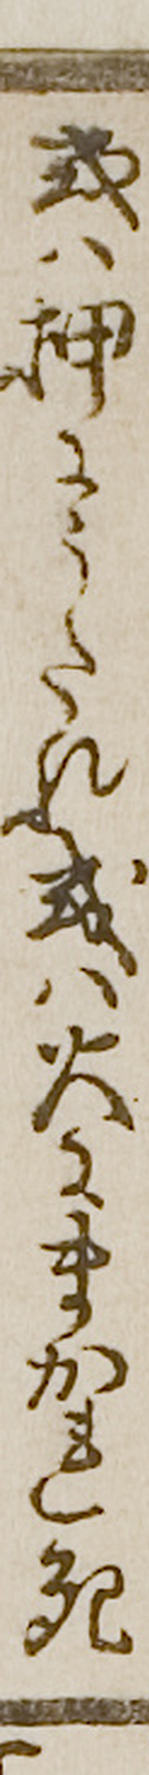或は押にうたれ或は火にまかれ死
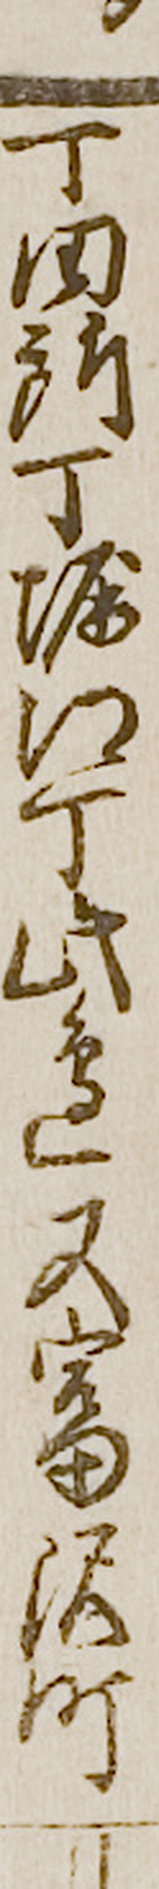丁田所丁堀江丁此辺又富沢町
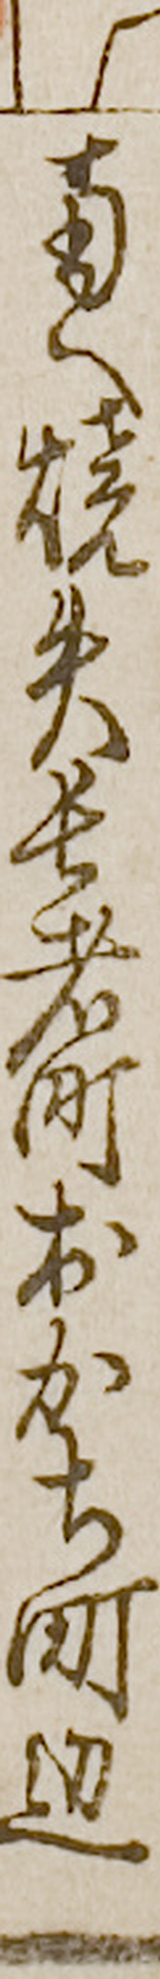南へ焼失長者町おかち町辺
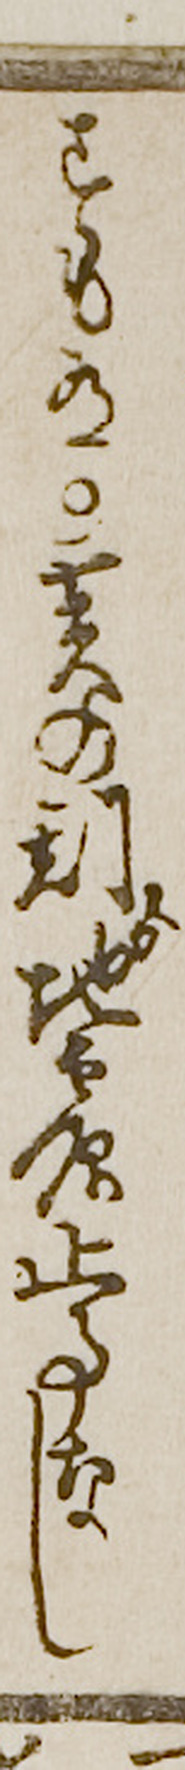すも有○亥の刻ゟ地震止事なし
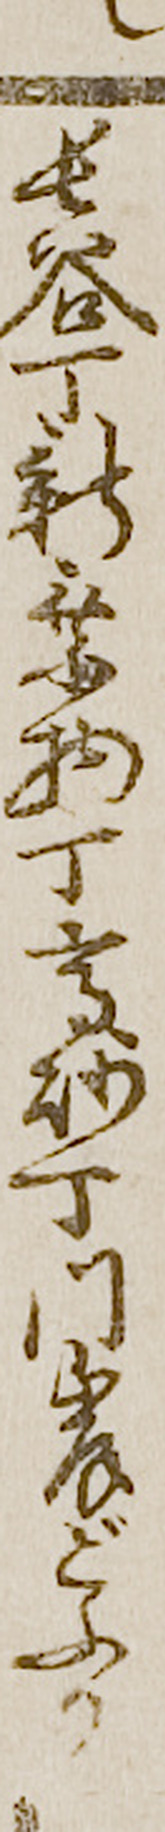長谷丁新乗物丁高砂丁川岸どふり
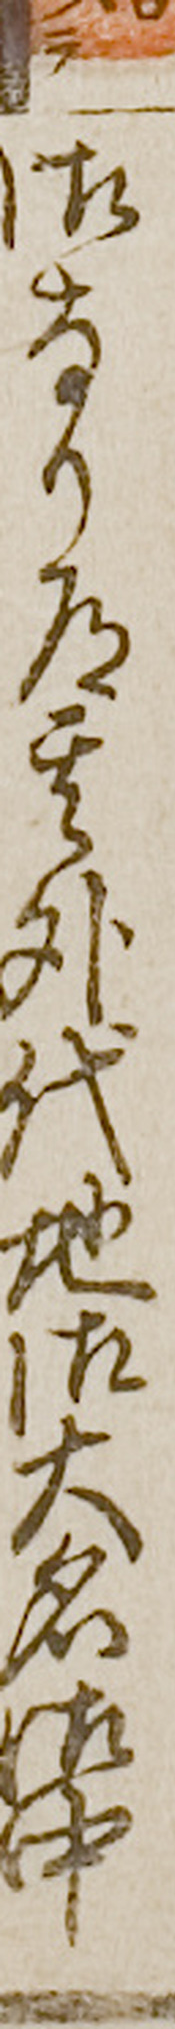御なり道其外代地御大名御中
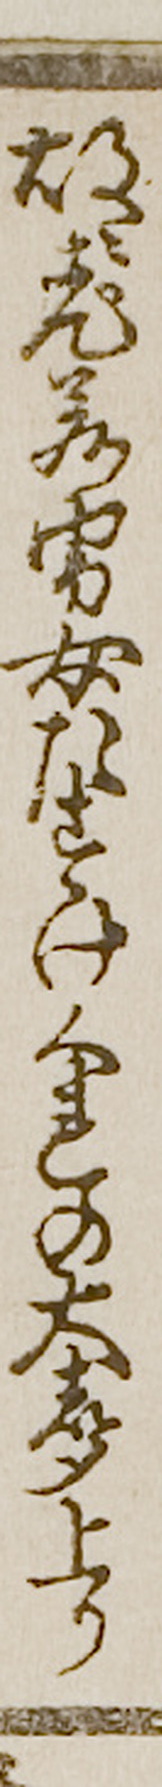故に老若男女たすけくれの大声上り
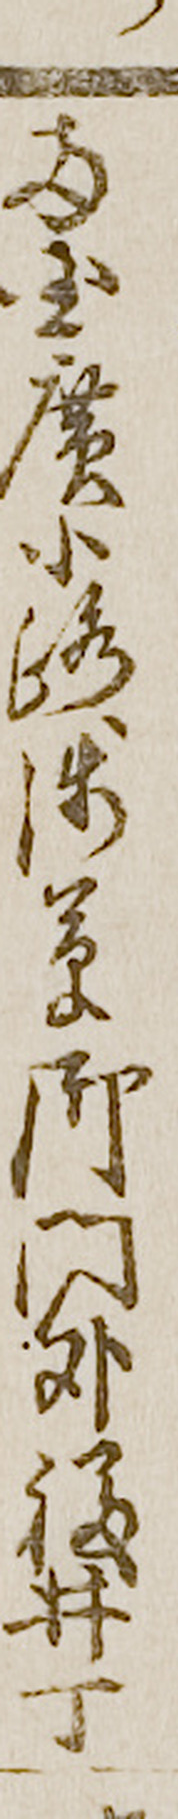両国広小路浅草御門外福井丁
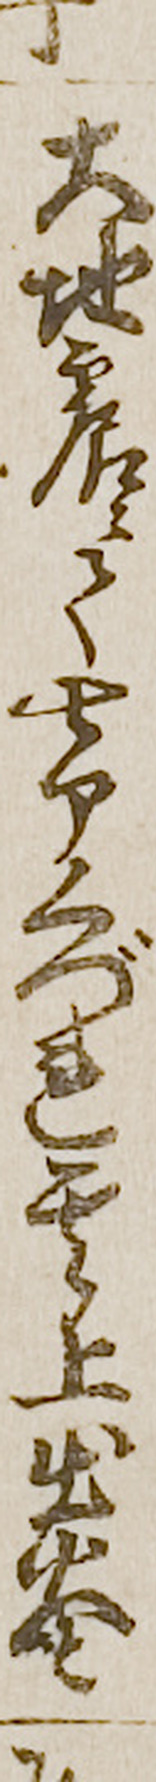大地震にて七部くづれ其上出火と
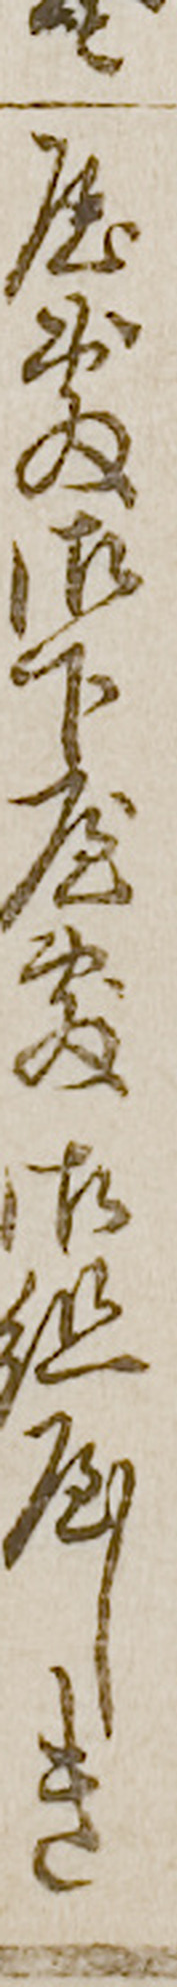屋敷御下屋敷御組屋しき
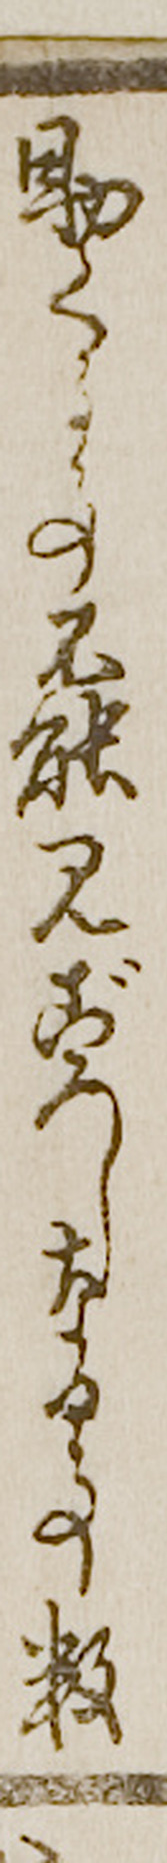助くる事不能見ごろしなる事数
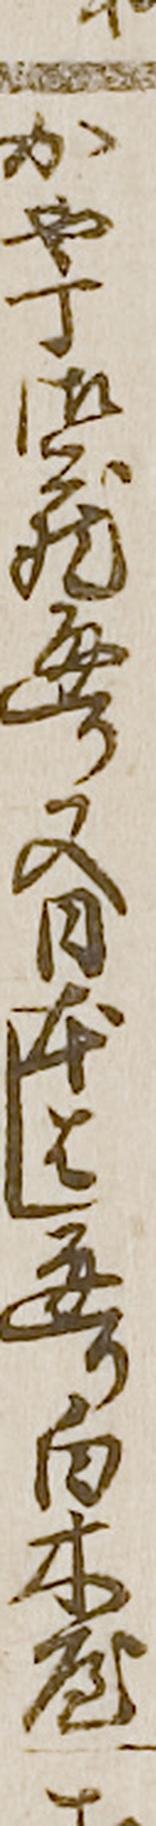かや丁御蔵通り又日本はし通り白木屋
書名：東都珍事実録咄
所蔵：東京大学総合図書館 General Library in the University of Tokyo, JAPAN
